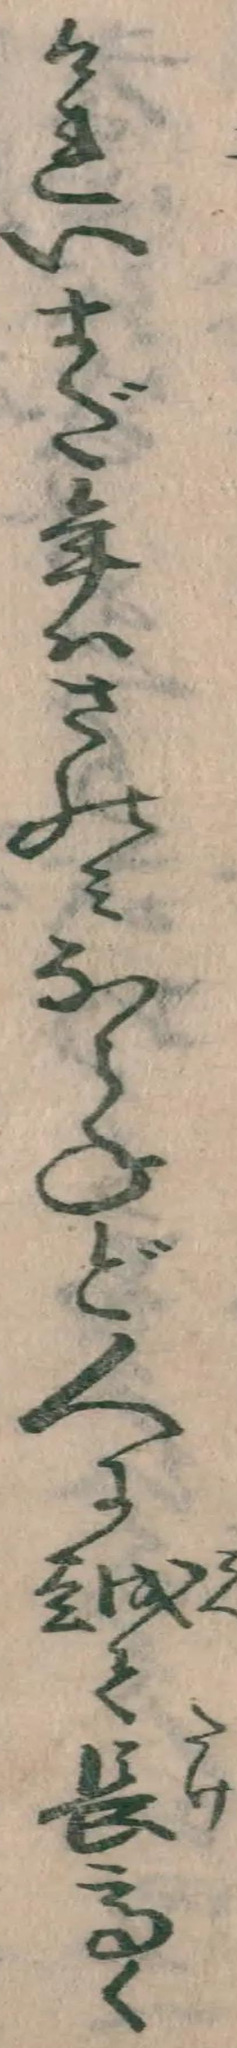けれいまだ年はさのみならねど人に越て長高く
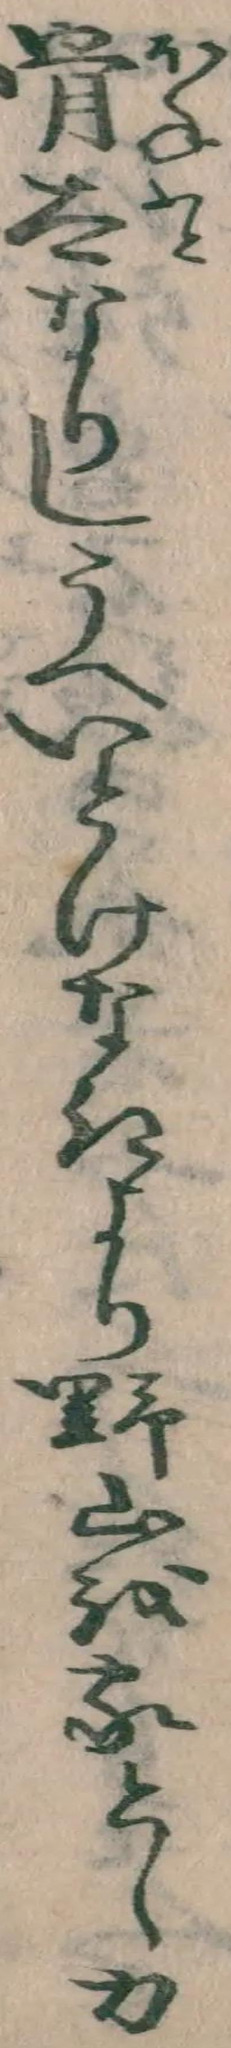骨太なりしうへいとけなきより野山を家とし力
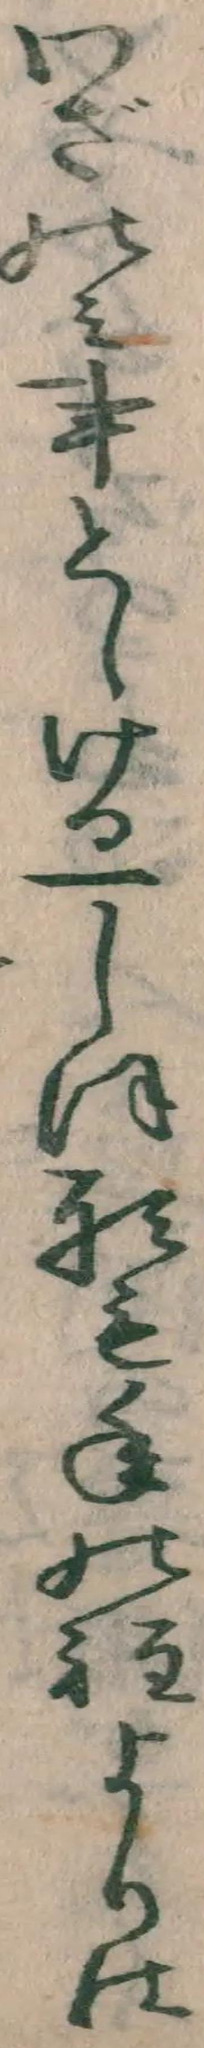わざのみ事としける一しほ形も年の程よりは
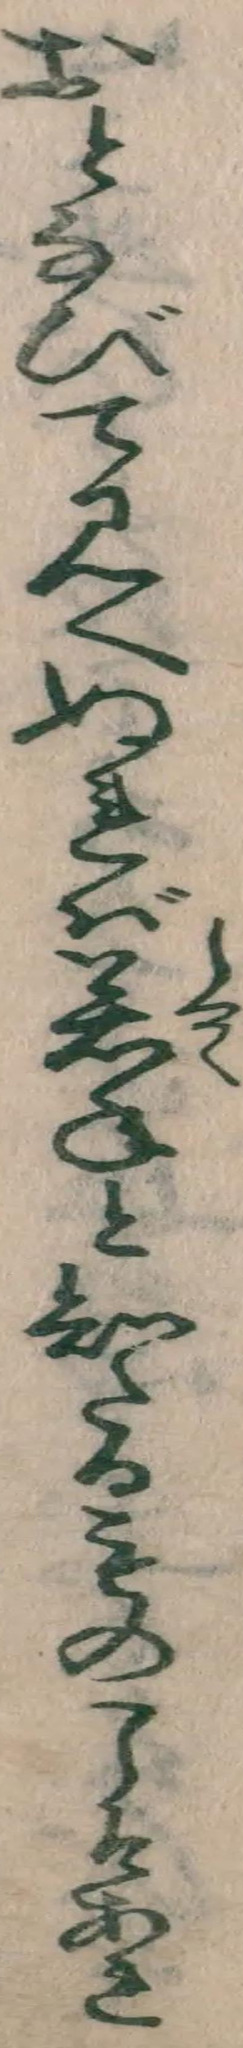おとなびて見へぬれば若年と知たるものこそあれ
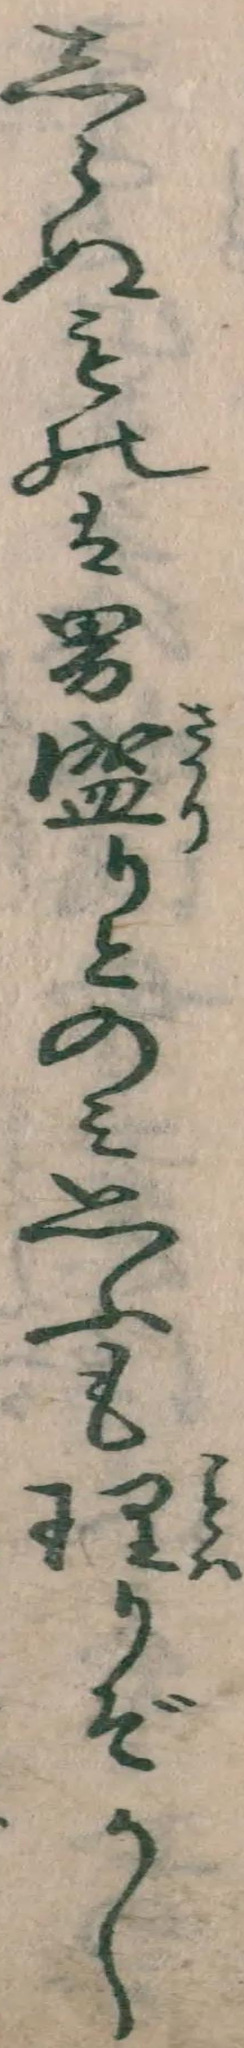しらぬものは男盛りとのみ思ふも理りぞかし
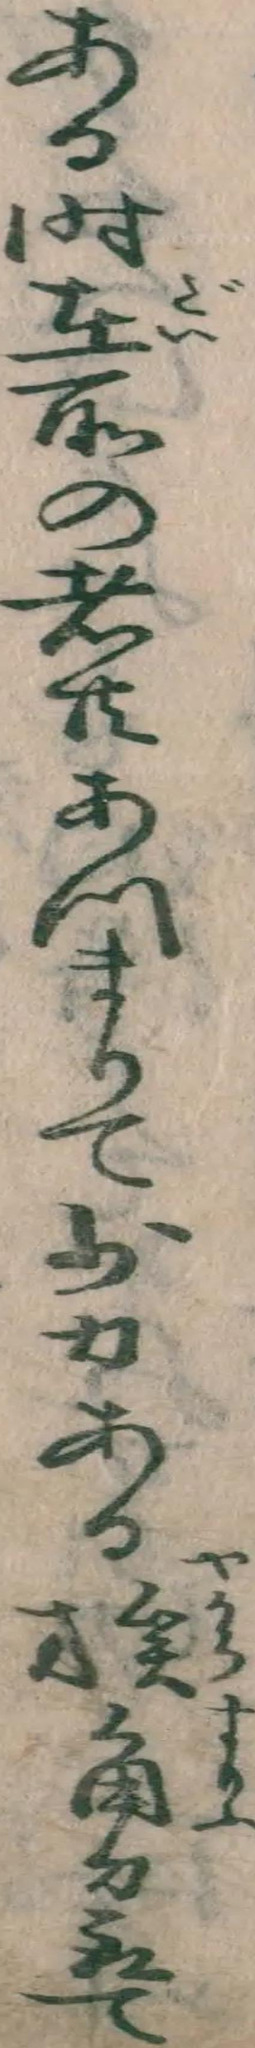ある時在所の者共あつまりて少力ある族角力取て
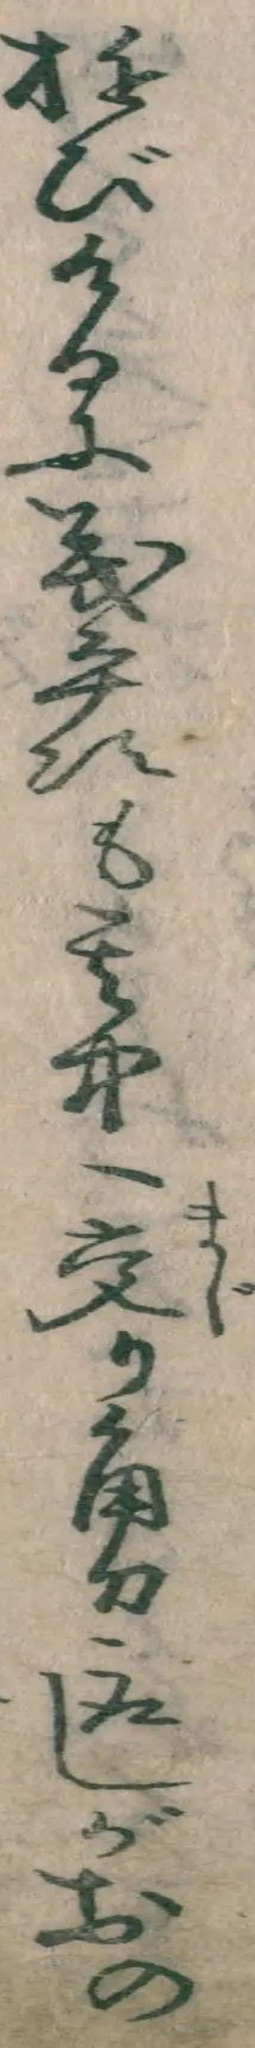遊びけるに義平次も其中へ交り角力取しがおの
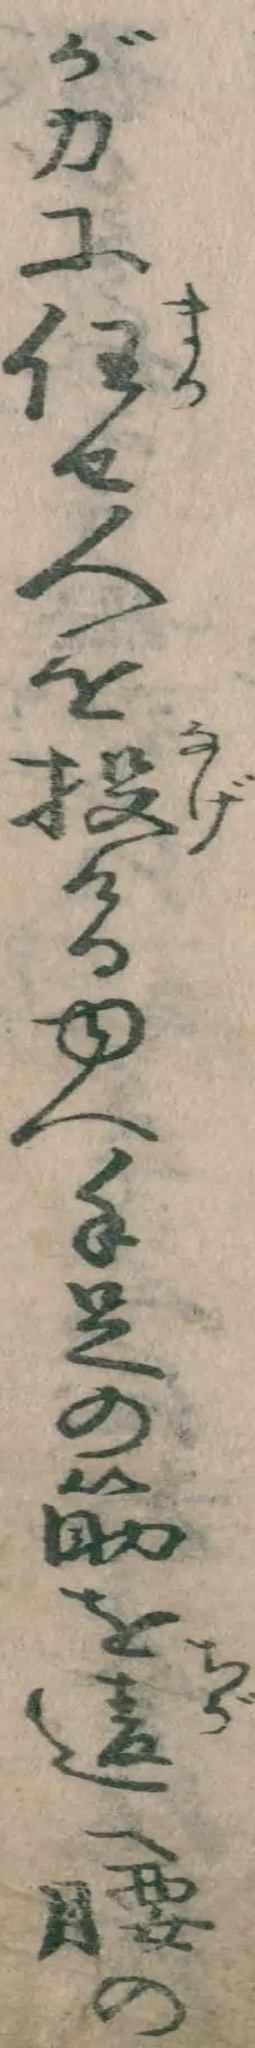が力に任せ人を投けるゆへ手足の筋を違へ腰の
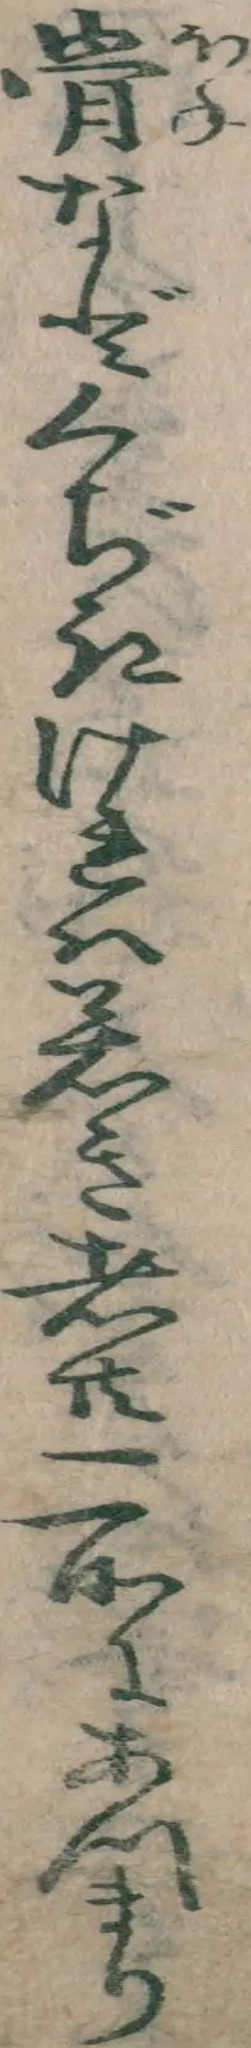骨などくぢきけれは若き者共一所にあつまり

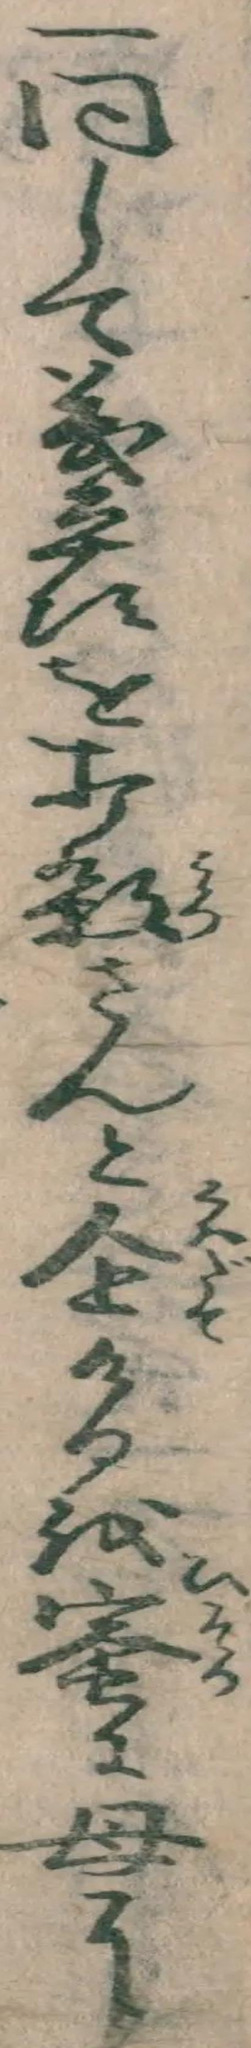一同して義平次を打殺さんと企けるを密に母に
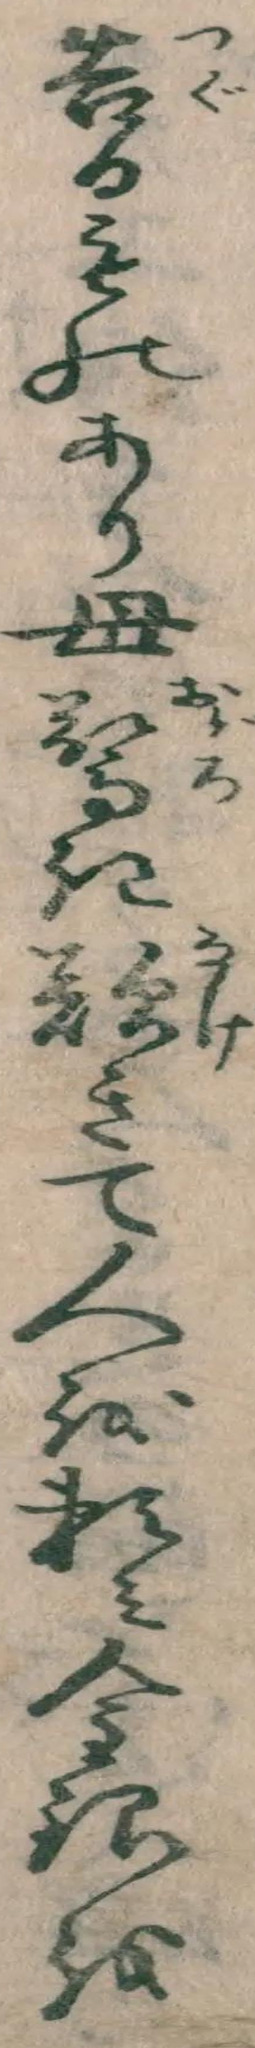告るものあり母驚き歎きて人を頼み金銀を
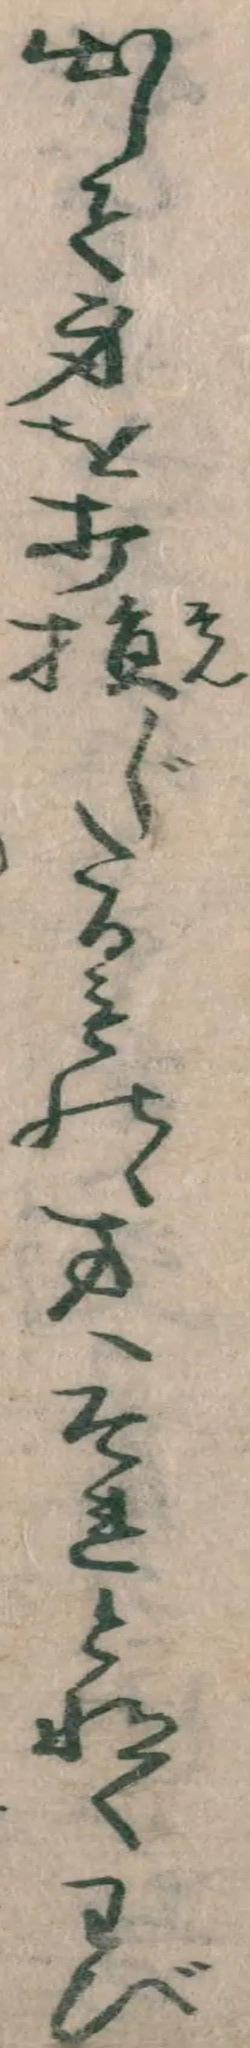出して身を打損じたるものゝ方へそれとなくわび
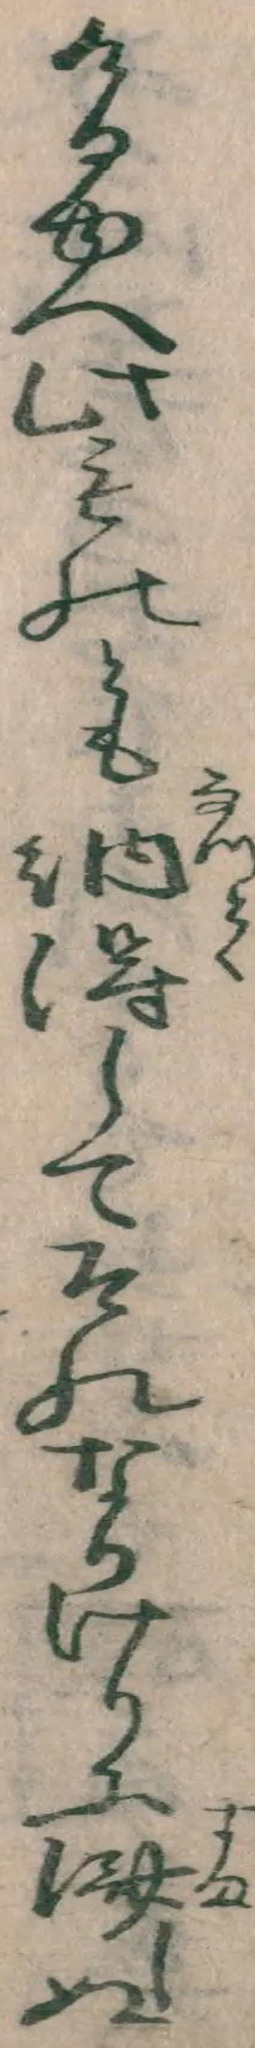けるゆへ此ものとも納得してそれなりけりに済しぬ
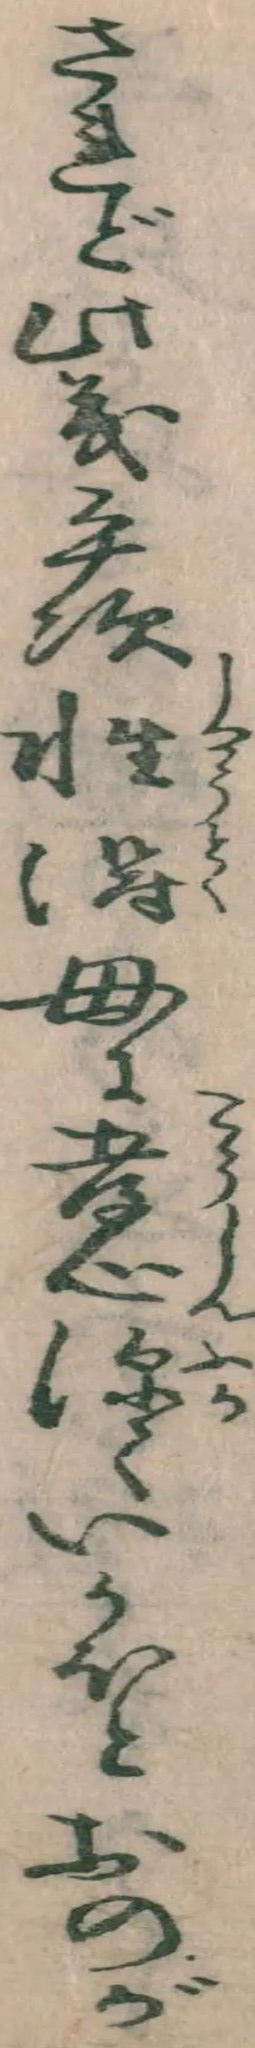されど此義平次性得母に孝心深くいかほとおのが
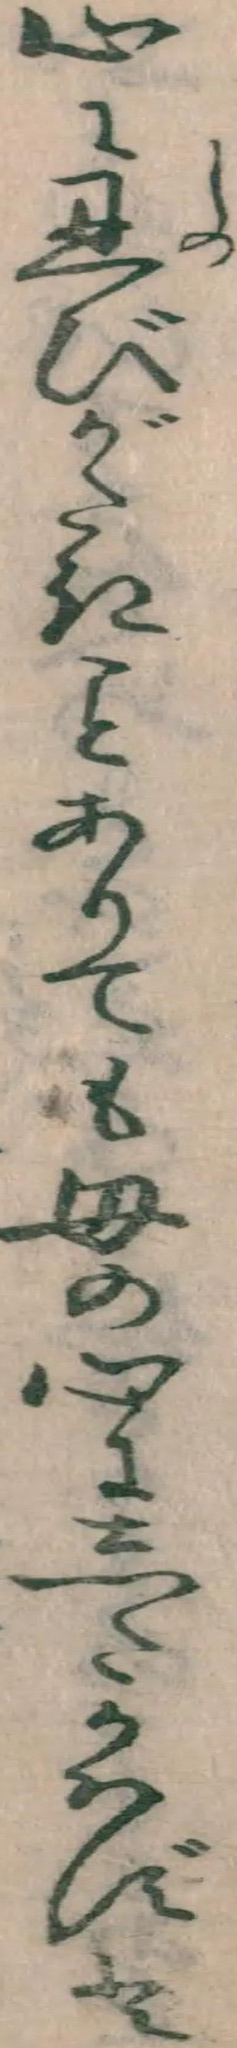心に忍びがたきことありても母の心にしたかはずと
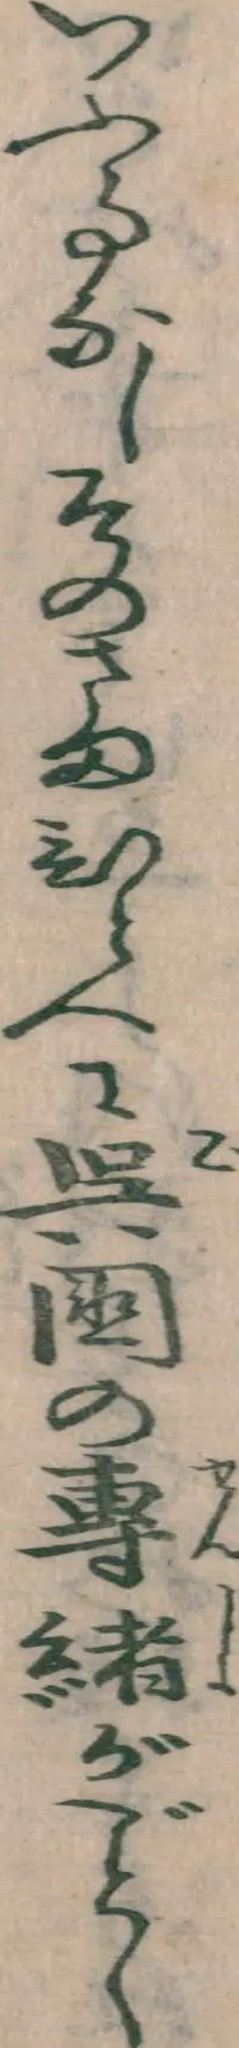いふ事なしそのさまひとへに呉国の専緒がごとく
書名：怪談御伽童 5巻. [1]
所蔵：国立国会図書館 National Diet Library, JAPAN
